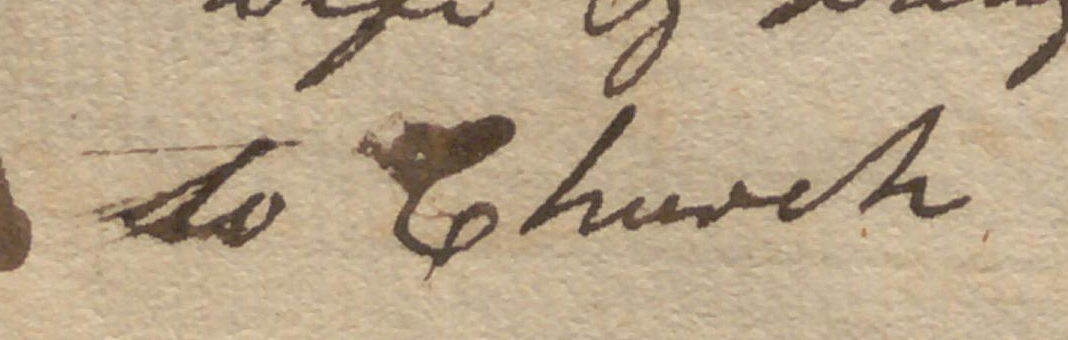to Church
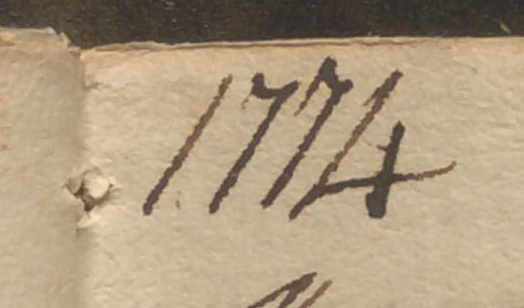1774
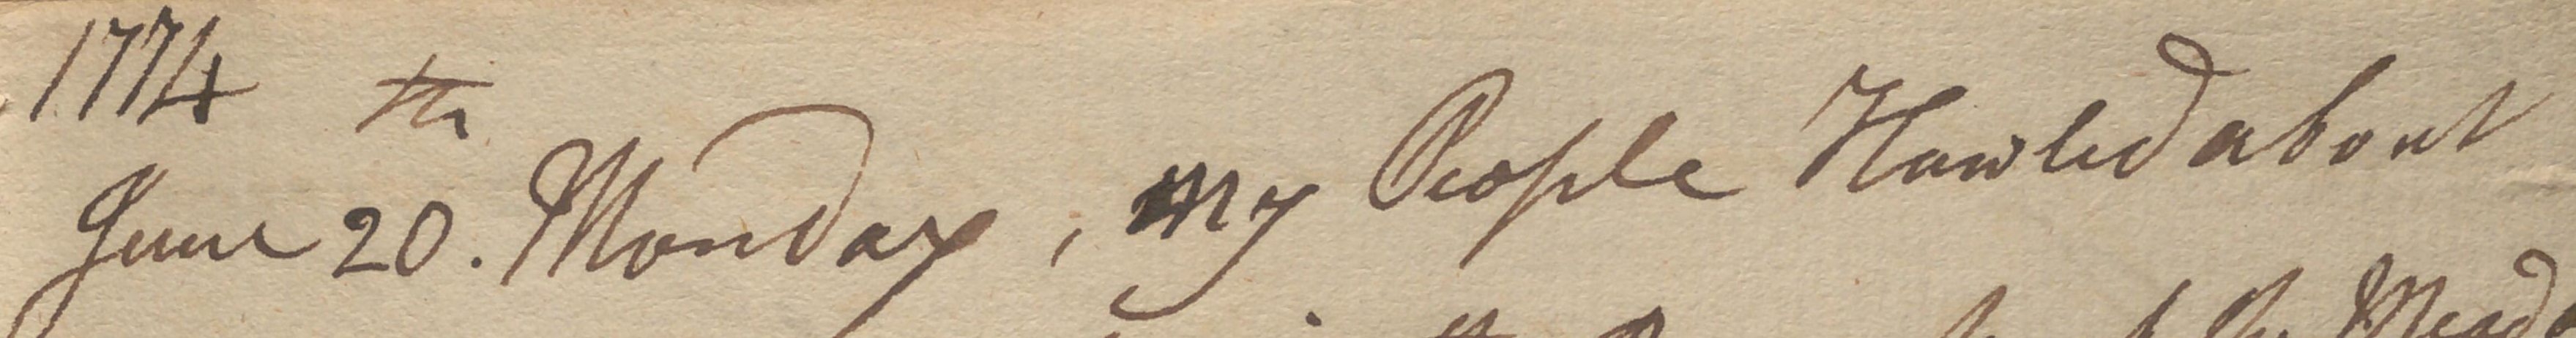June 20^th. Monday, My People Hawled about
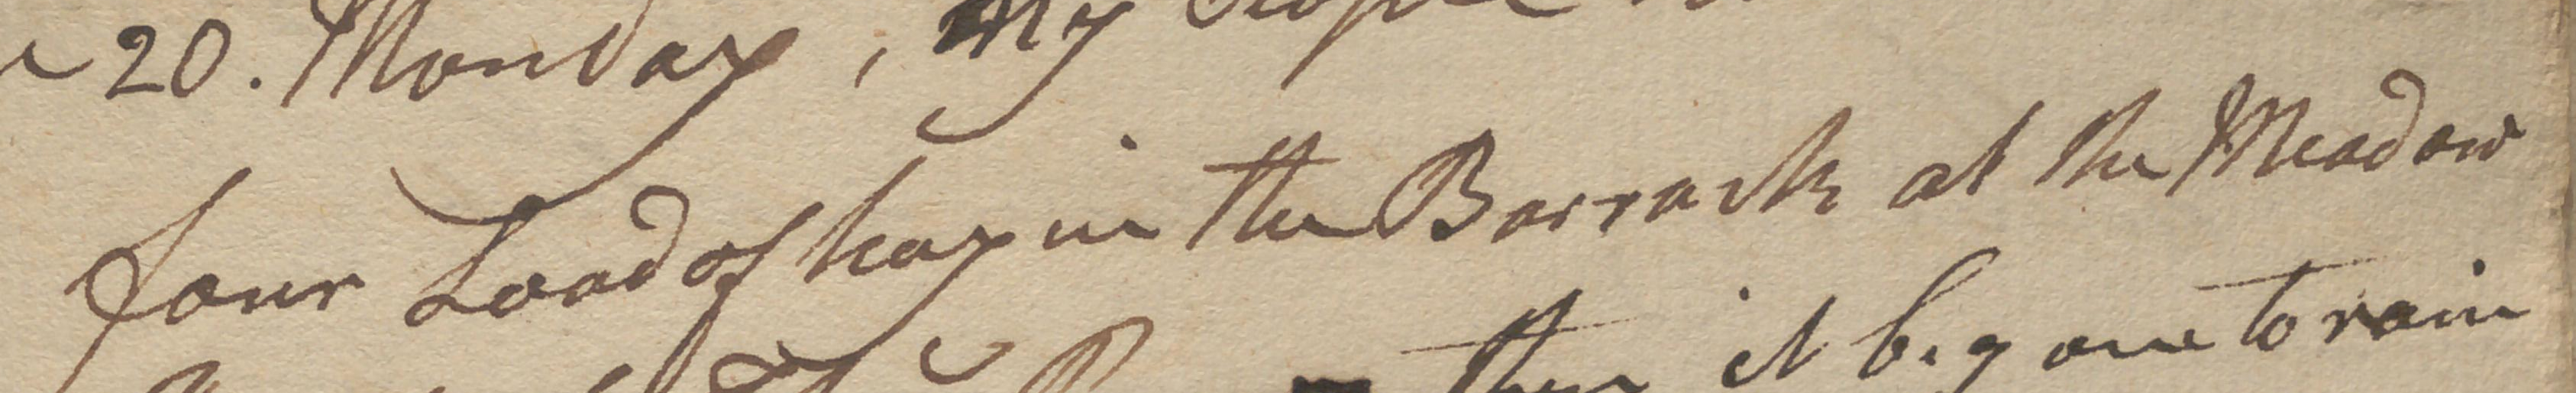four Load of hay in the Barrack at the Meadow
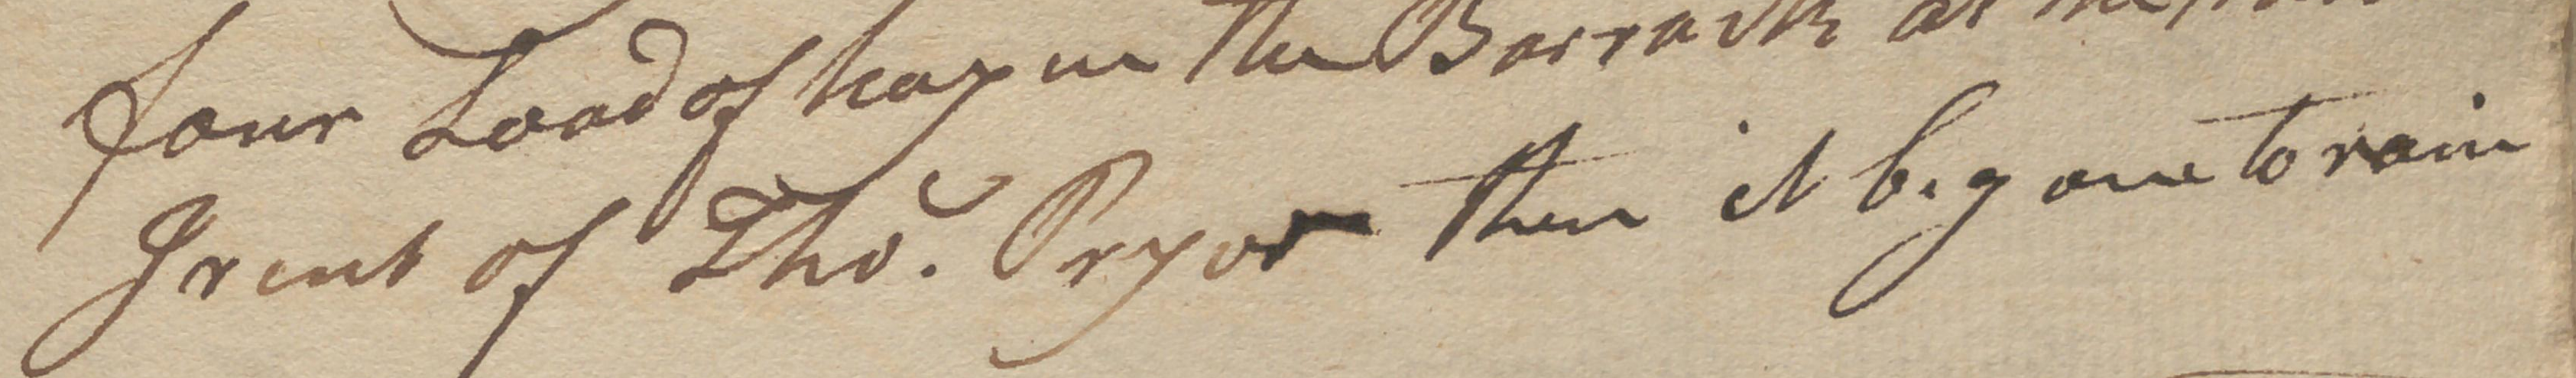I rent of Tho^s. Pryor then it big one to rain
